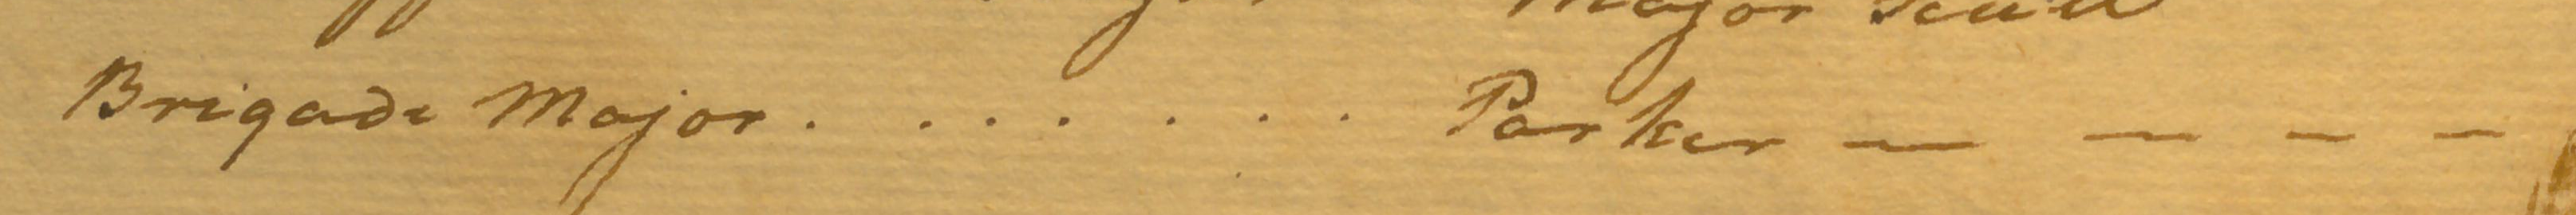Brigade Major ....... Parker ----
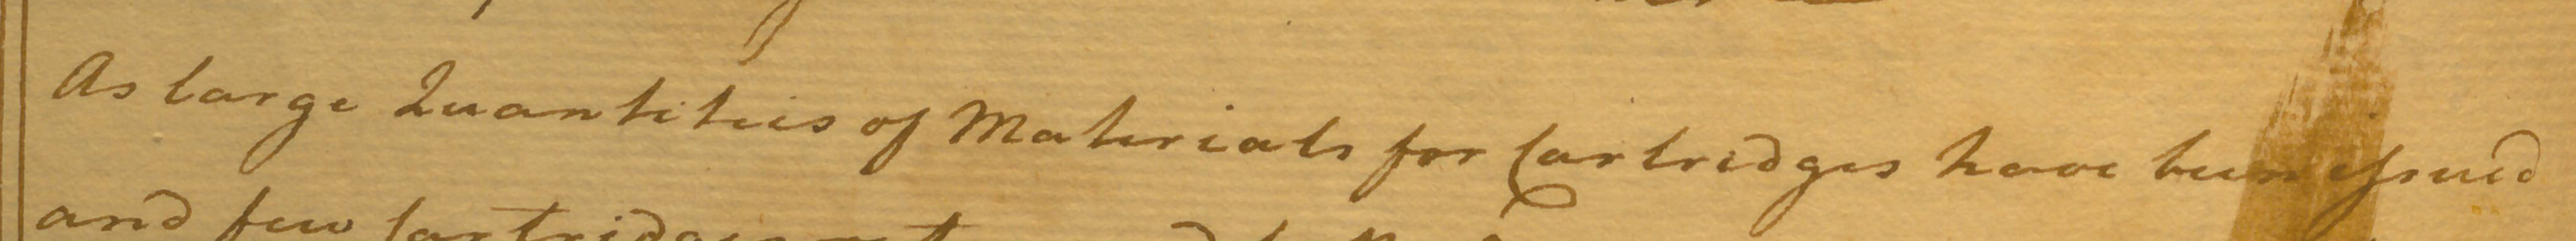As large Quantities of Materials for Cartridges have been issued
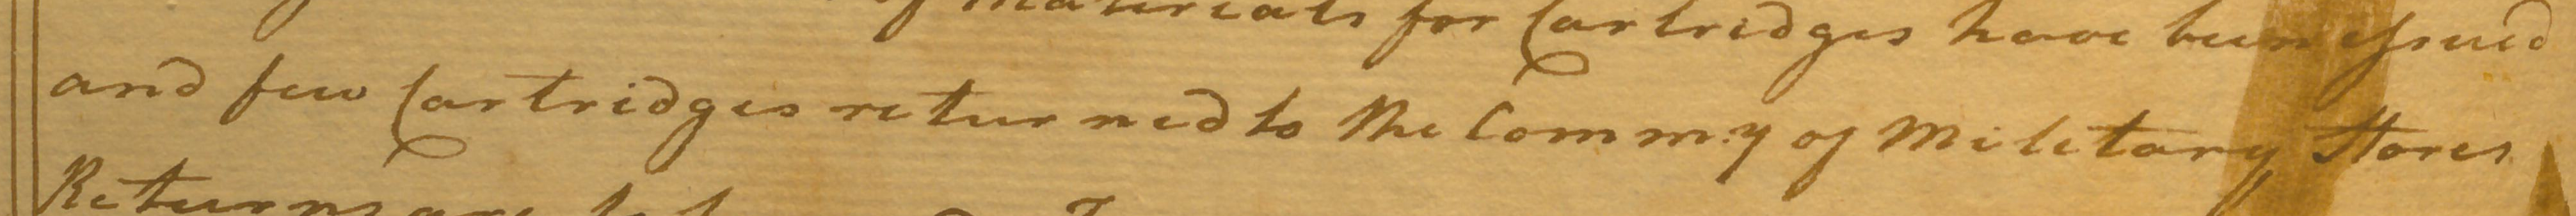and few Cartridges returned to the Comm:y of Military Stores
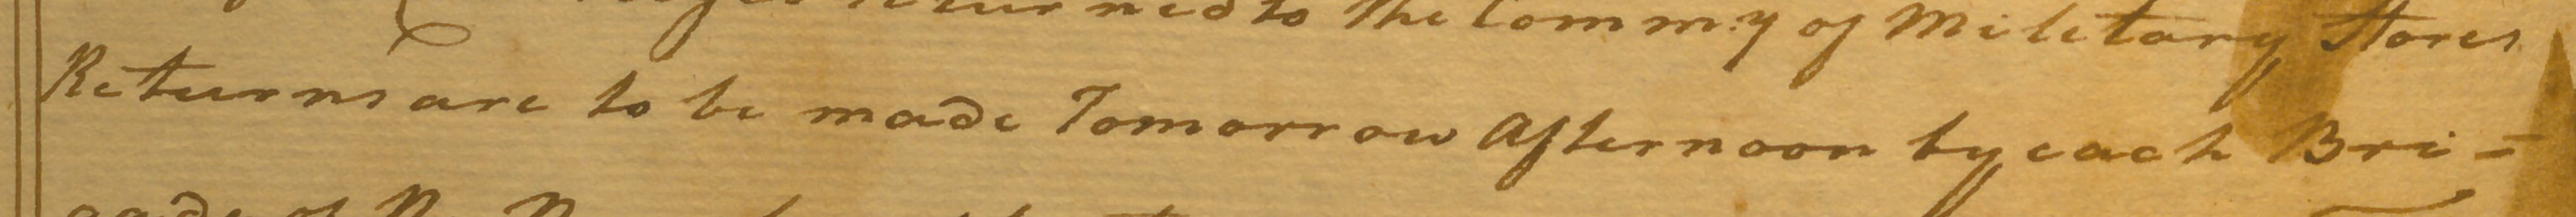Returns are to be made Tomorrow afternoon by each Bri-
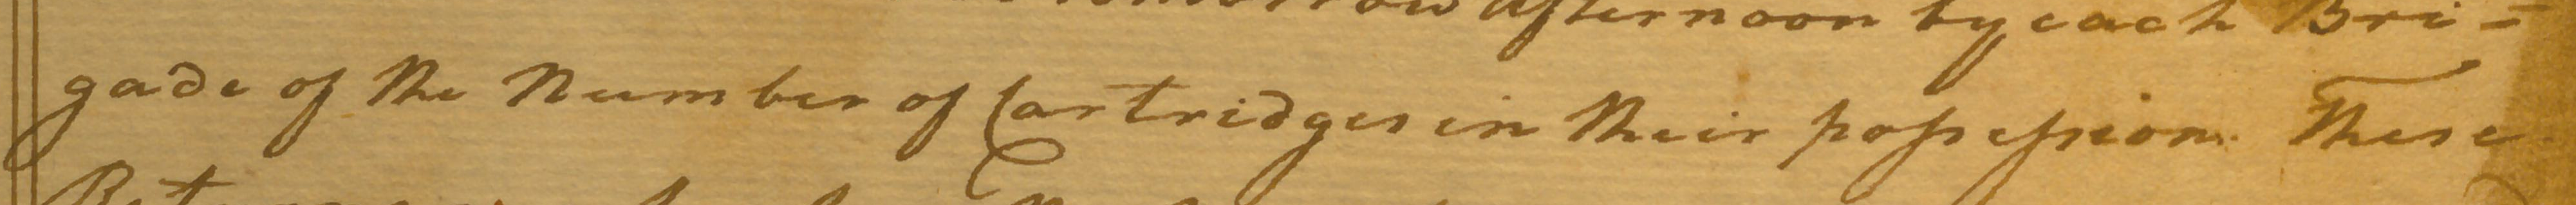gade of the Number of Cartridges in their possession. These
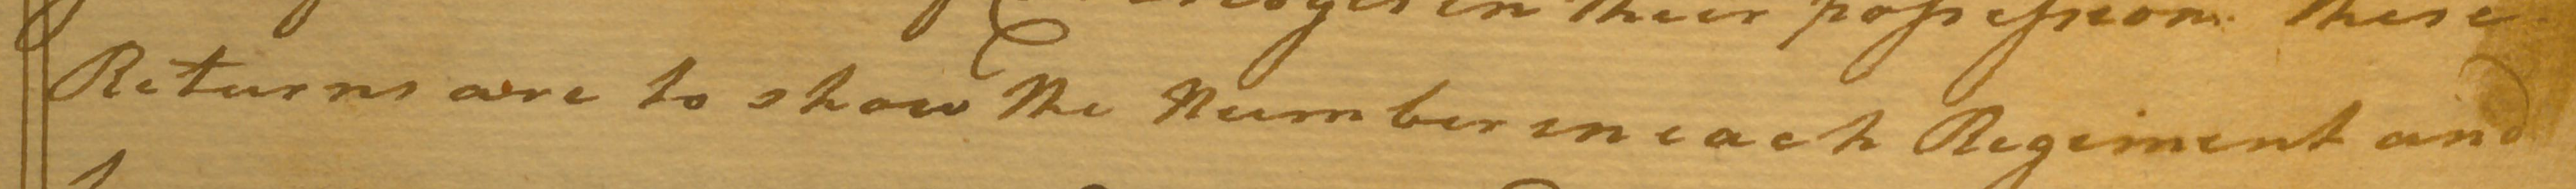Returns are to show the Number in each Regiment and
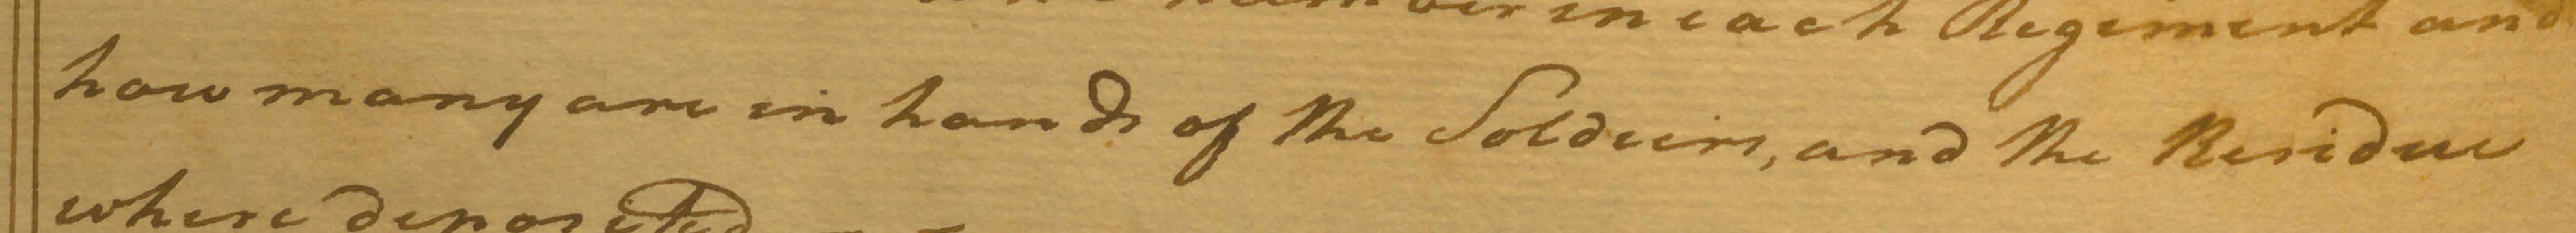how many are in hands of the Soldiers, and the Residue
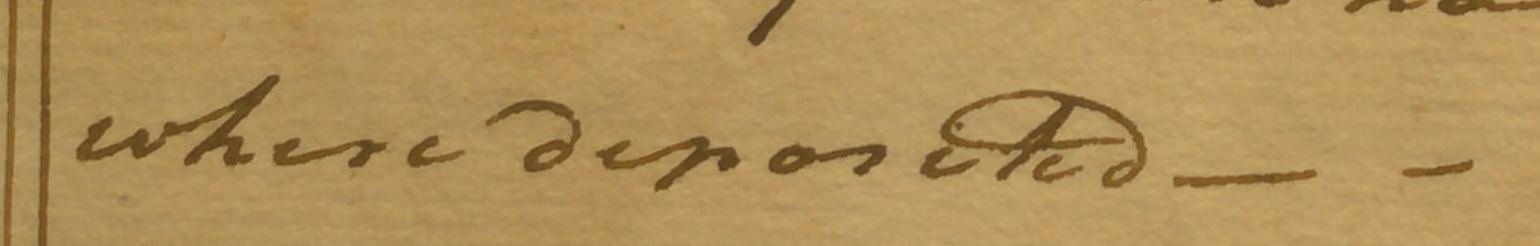where deposited--
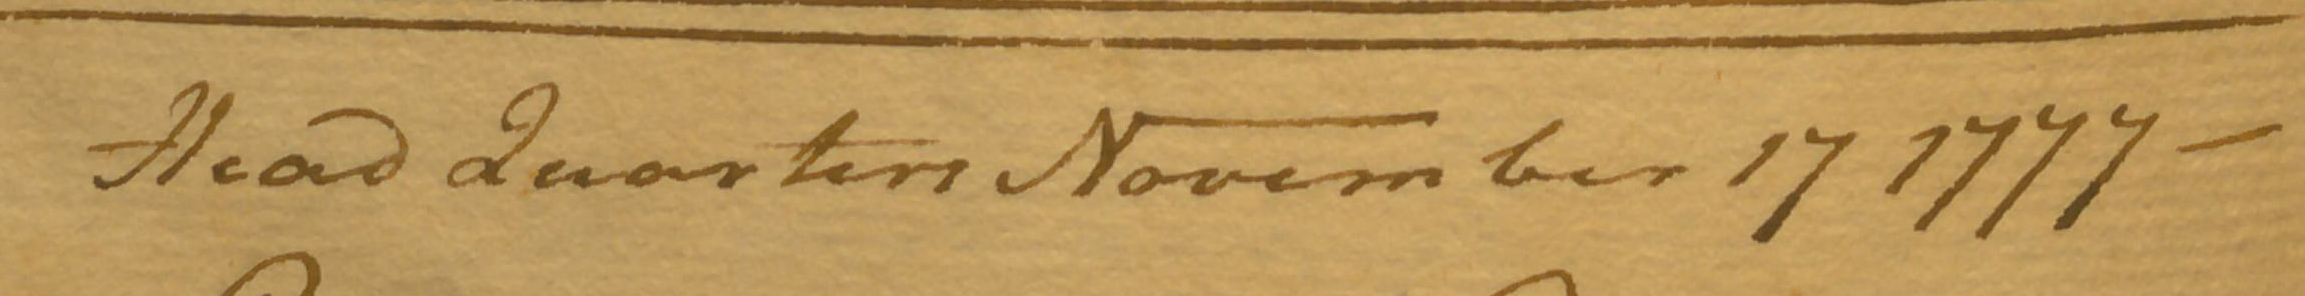Head Quarters November 17 1777-
